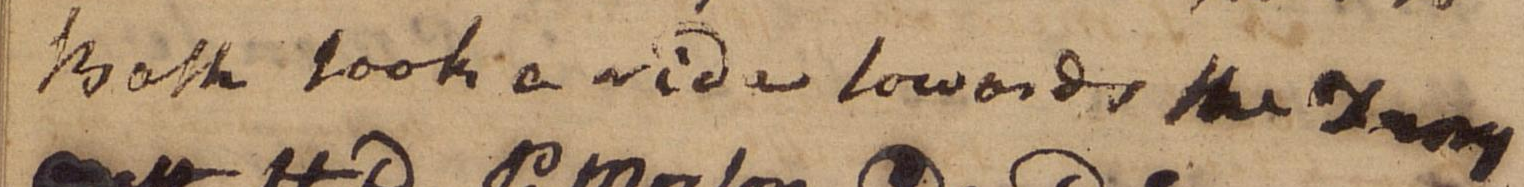Bath took a ride towards the Ferry
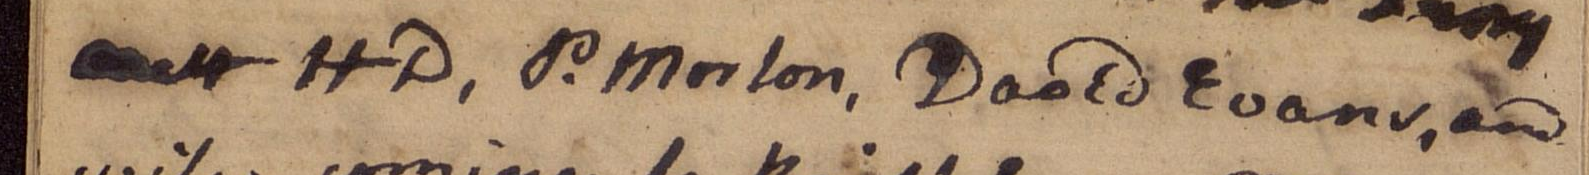mett HD. P Morton, David Evans, and
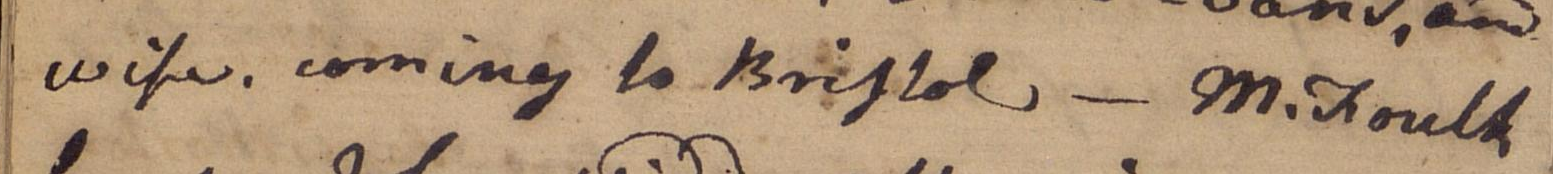wife, coming to Bristol,- M. Foulk
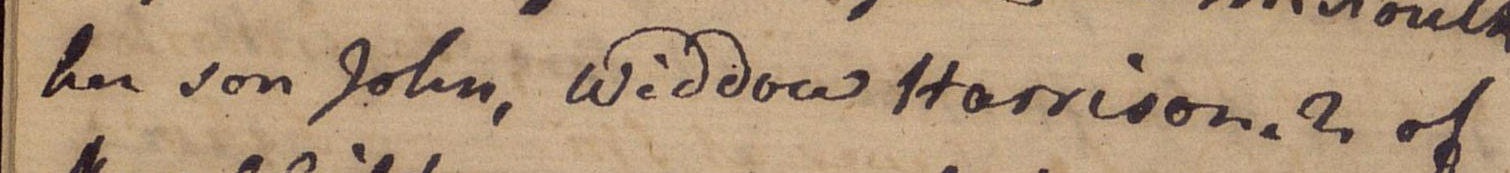her son John, widdow Harrison. 2 of
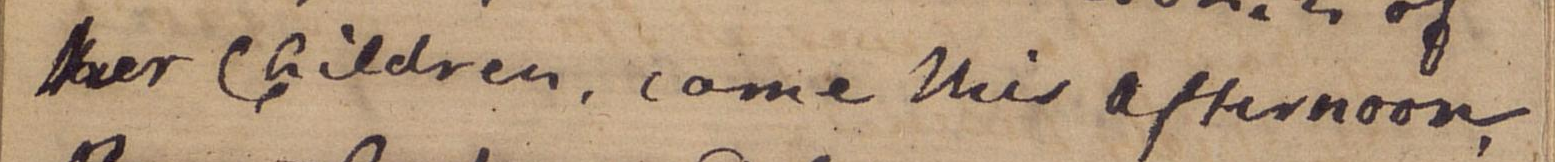her Children, came this Afternoon,
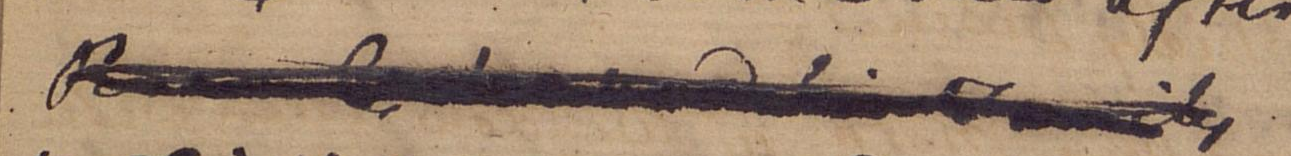[P_______ ___ ____ ___ Family]]
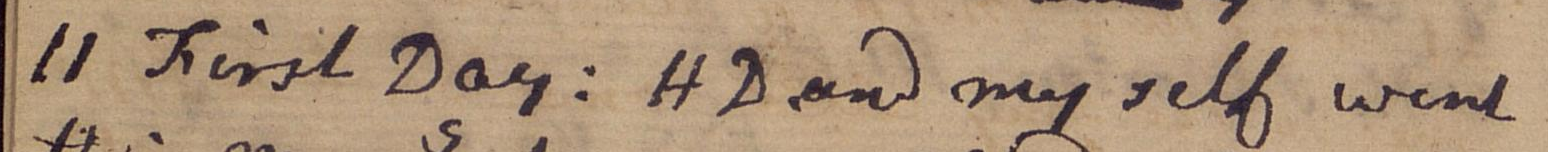11 First Day: HD. and my self went
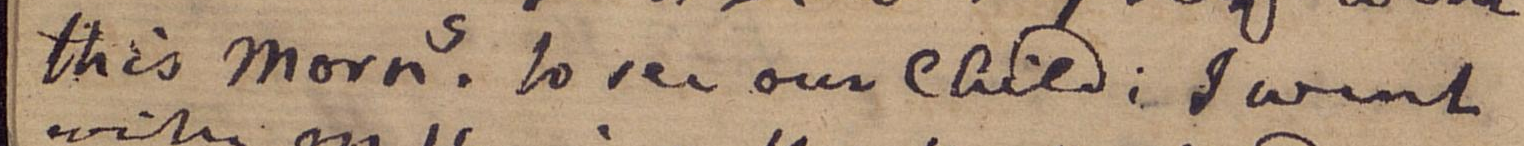this morn^g. to see our Child; I went
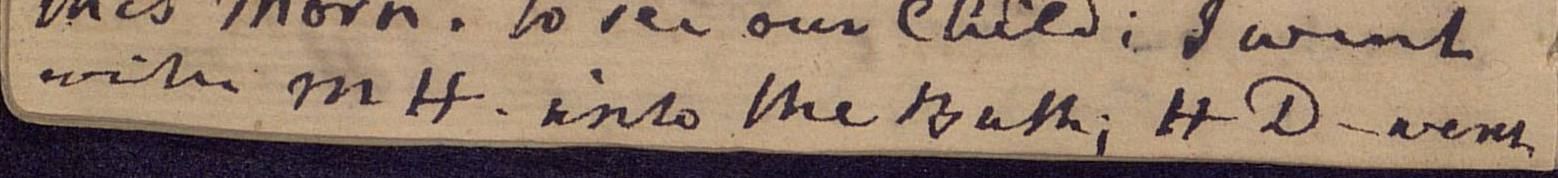with MH. into the Bath; H D- went
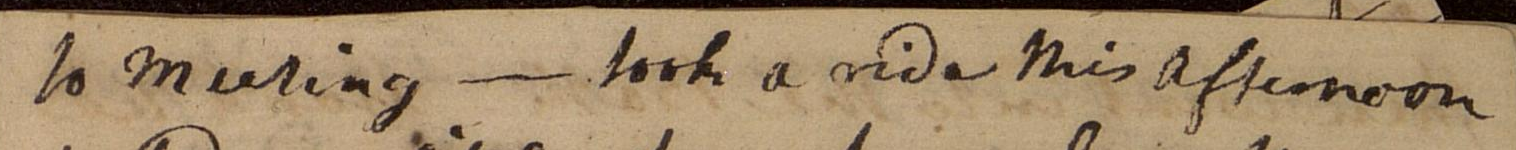to Meeting- took a ride this afternoon
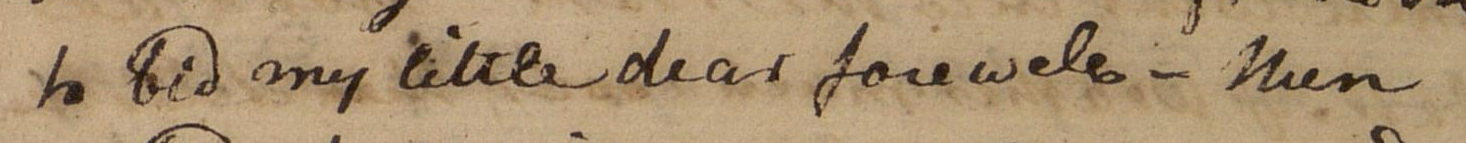to bid my little dear farewell- Men
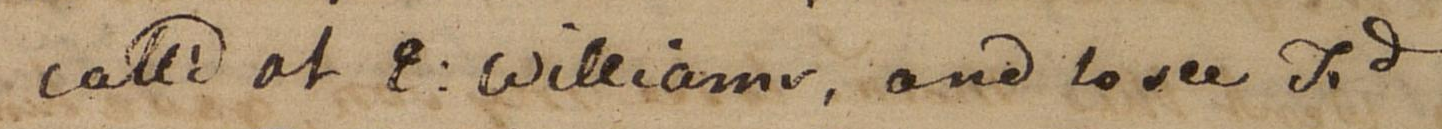call'd at E: Williams, and to see F^d
